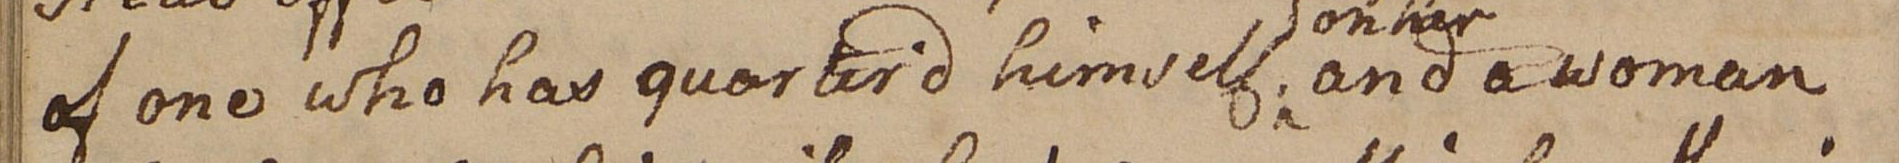of one who has quarter'd himself, ^ and a woman
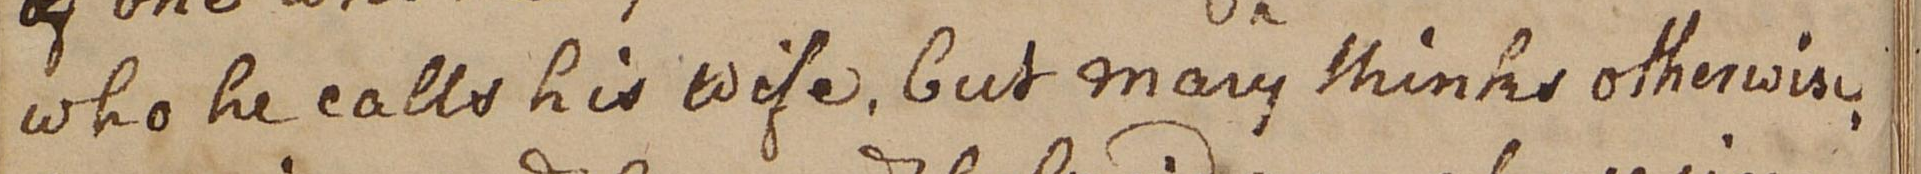who he calls his wife, but Mary thinks otherwise,
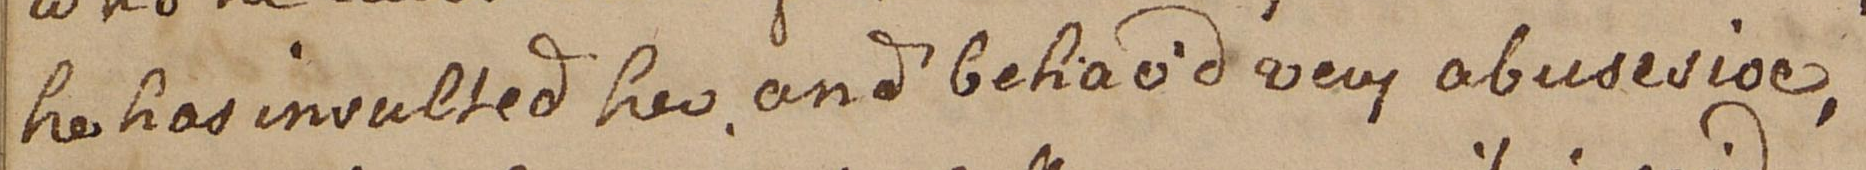he has insulted her, and behav'd very abusesive,
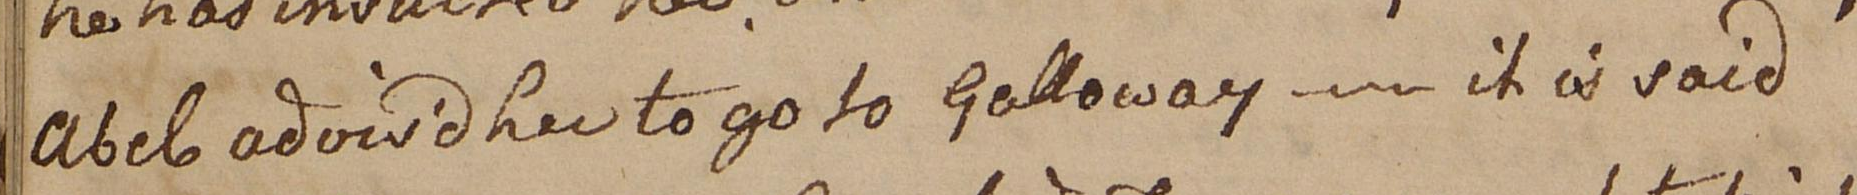Abel advis'd her to go to Galloway - it is said
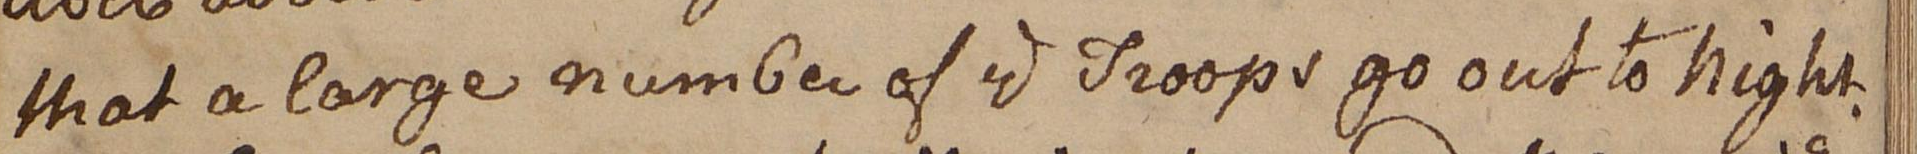that a large number of y^e Troops go out to Night.
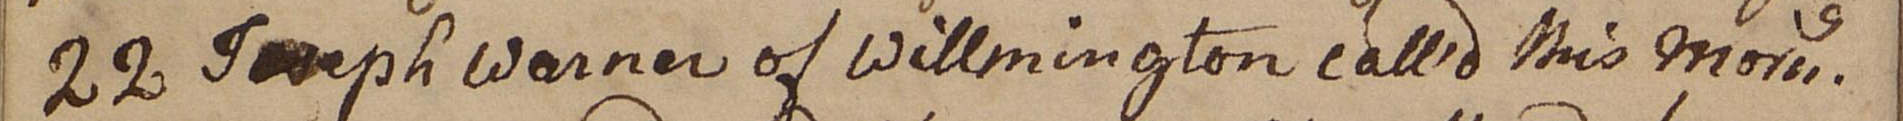22 Joseph Warner of Willmington call'd this Morn^g.
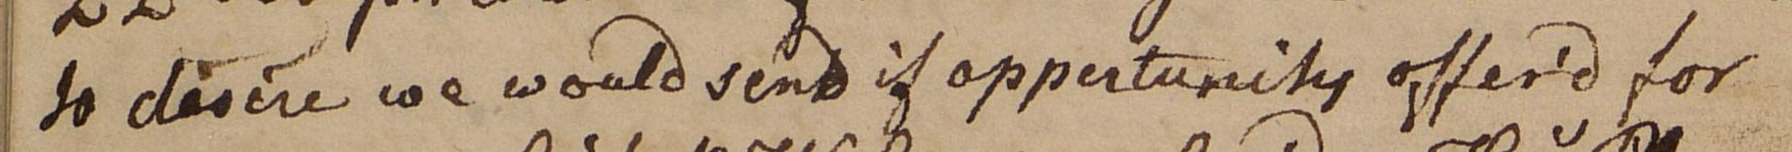to desire we would send if oppertunity offer'd for
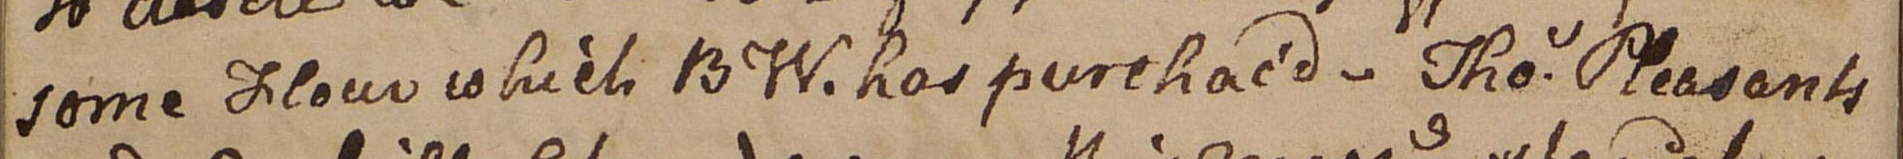some Flour which B W. has purchac'd- Tho^s. Pleasents
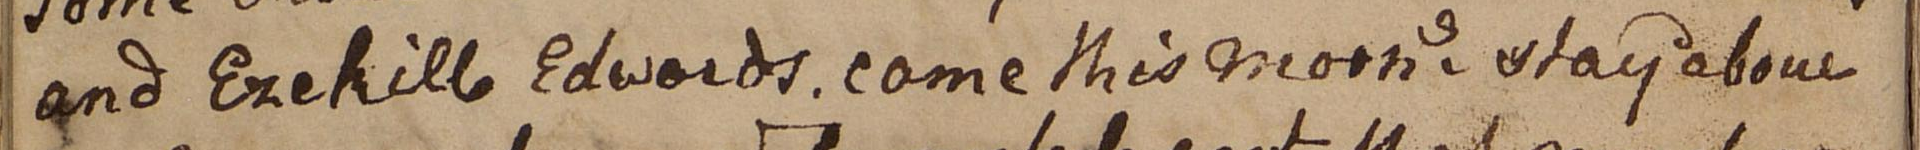and Ezekill Edwards came this Morn^g. stay^d aboue
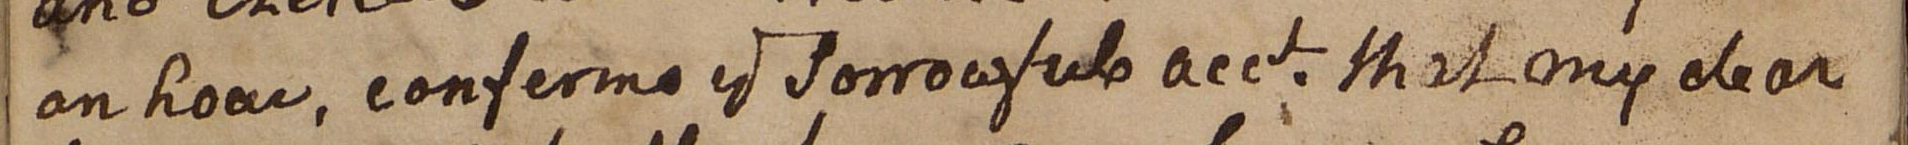on hour, conferms y^e Sorrowful acc^t. that my dear
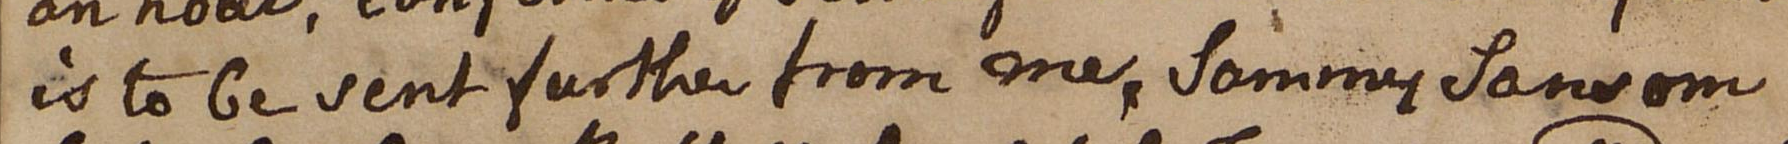is to be sent further from me, Sammy Sansom
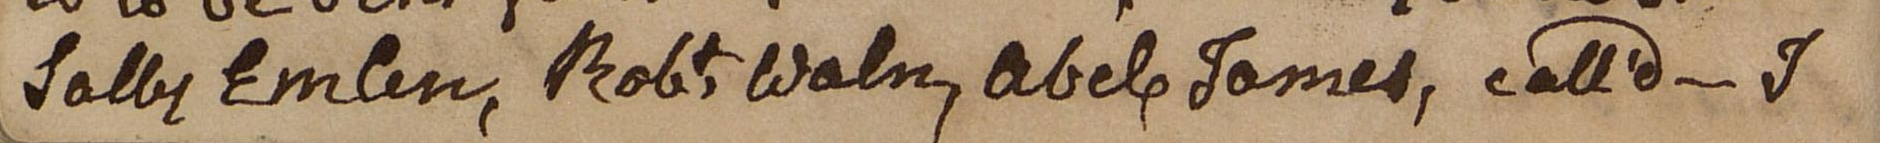Sally Emlen, Rob^t. Waln, Abel Jones, call'd- I
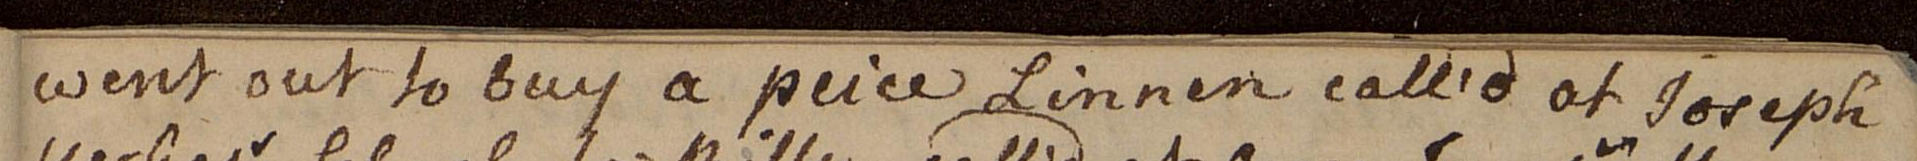went out to buy a peice Linnen call'd at Joseph
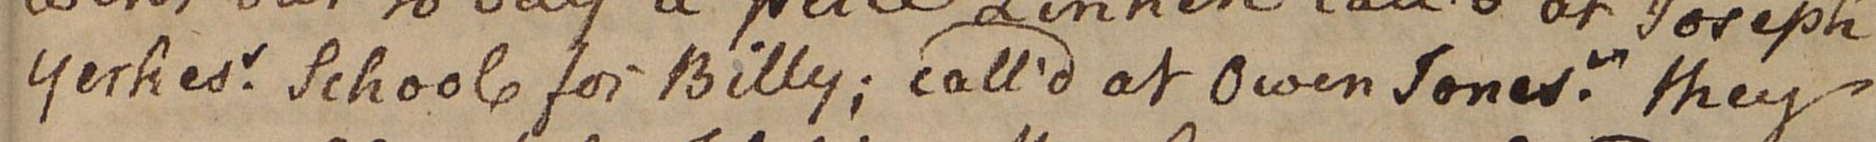Yorkes^s. School for Billy; call'd at Owen Jones^s they
